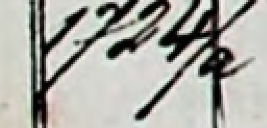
1724/a
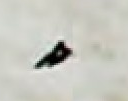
„
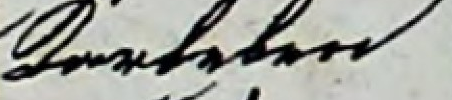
Karteten
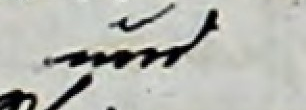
und
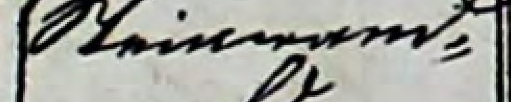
Steinwald„
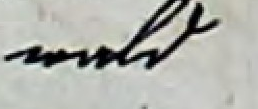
wald
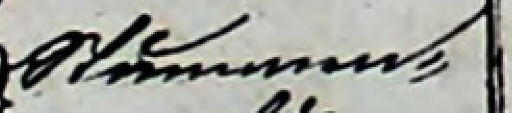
Stummen„
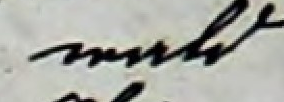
wald
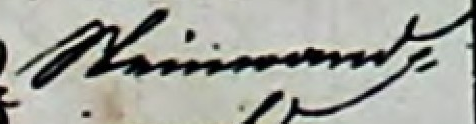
Steinwand„
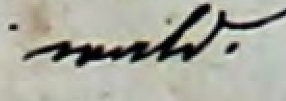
wald.
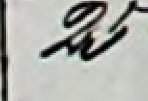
25
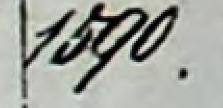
1590
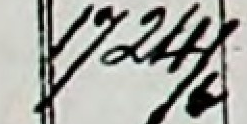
1724/b
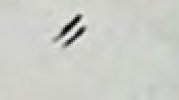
„
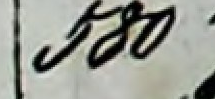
580
